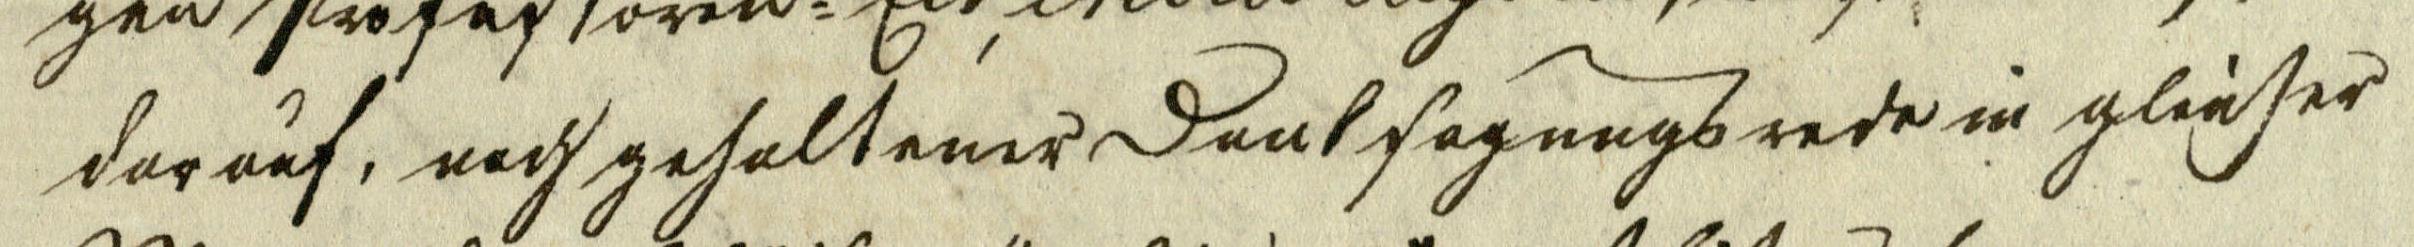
darauf, nach gehaltener Danksagungsrede in gleicher
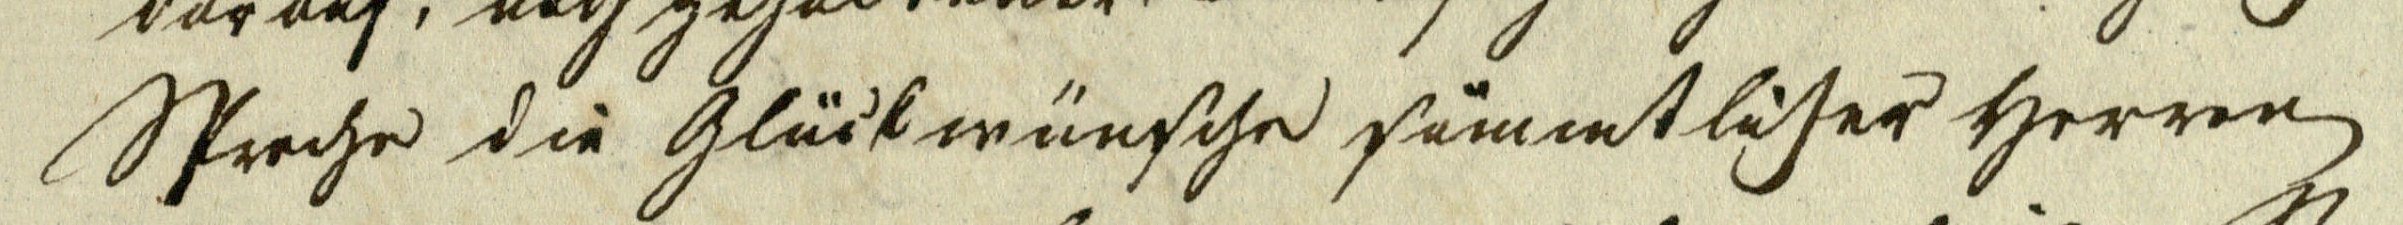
Sprache die Glückwünsche sämmtlicher Herren
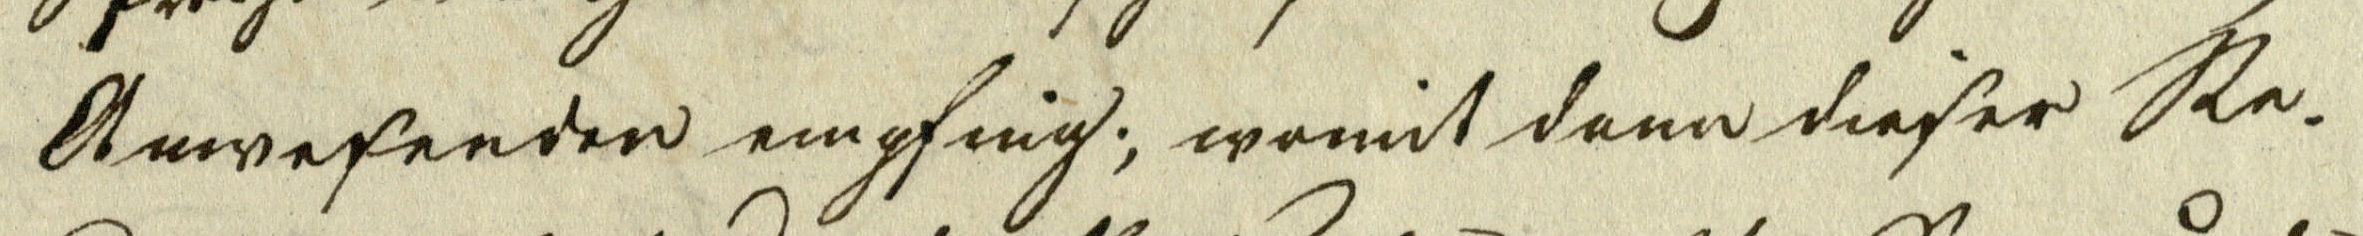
Anwesenden empfing; womit dann dieser Re¬
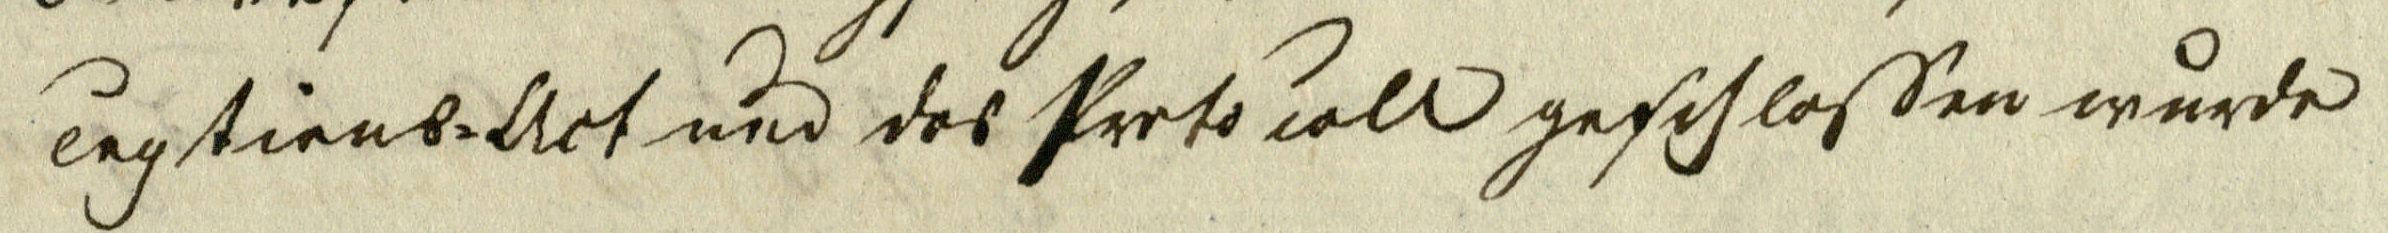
ceptions-Act und das Protocoll geschlossen wurde.
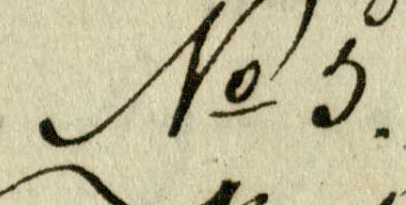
Nº 5.
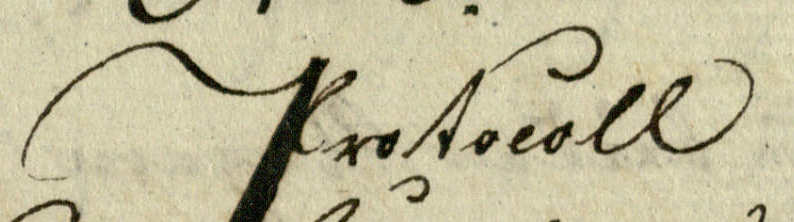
Protocoll
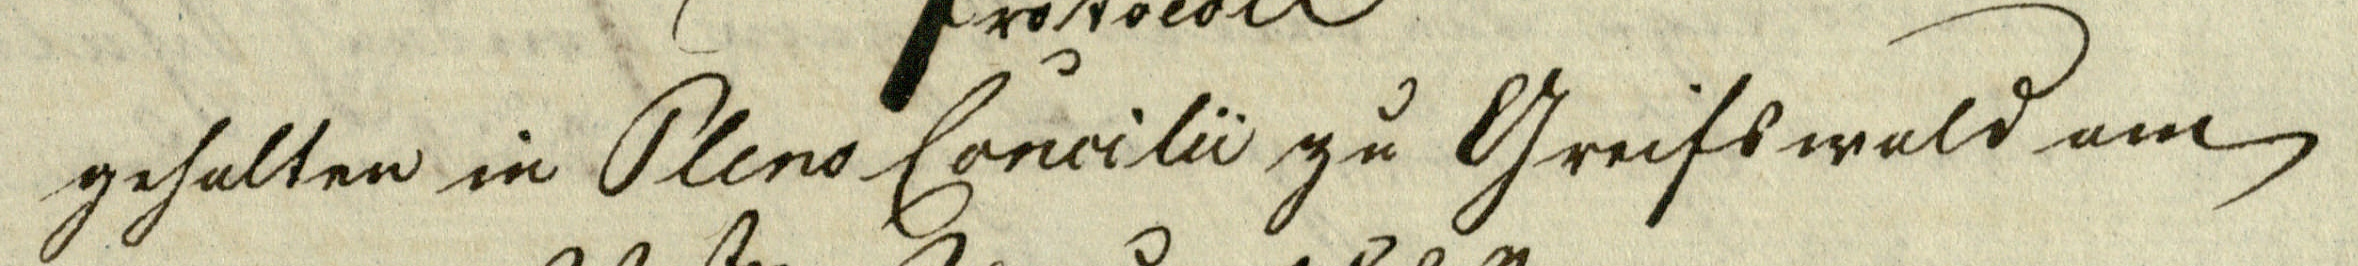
gehalten in Pleno Concilii zu Greifswald am
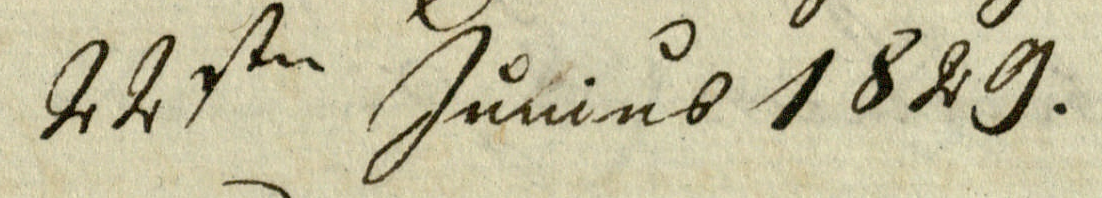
22sten Junius 1829.
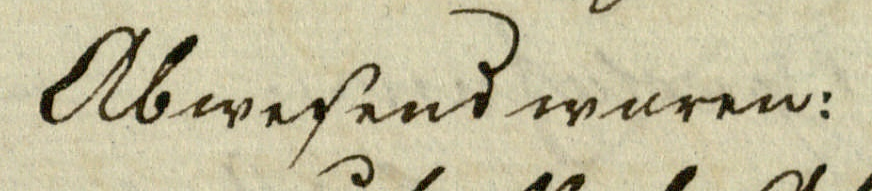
Abwesend waren:
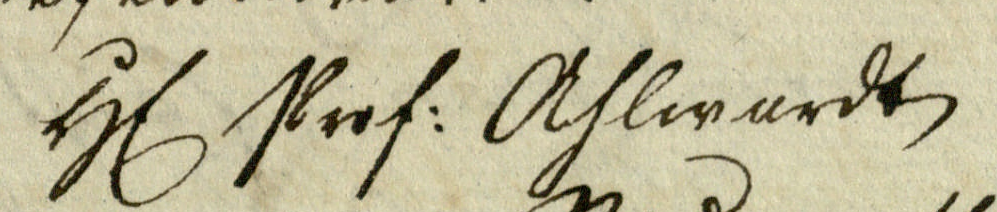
HE Prof: Ahlwardt,
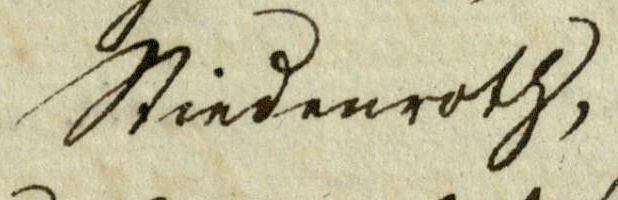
Stiedenroth,
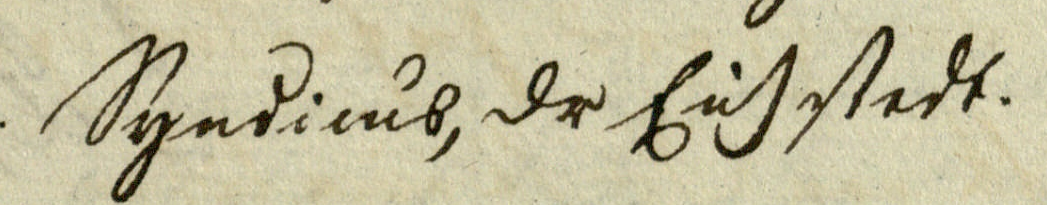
Syndicus Eichstedt.
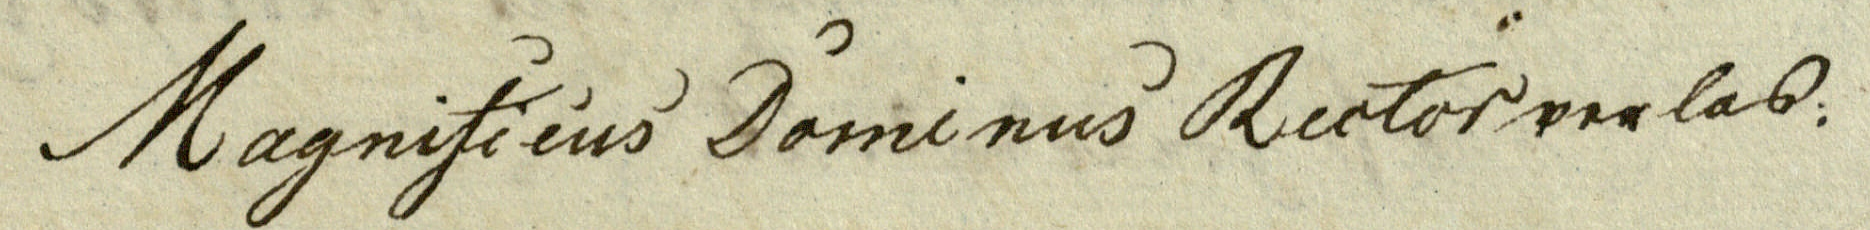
Magnificus Dominus Rector verlas:
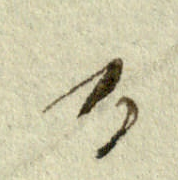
1,
